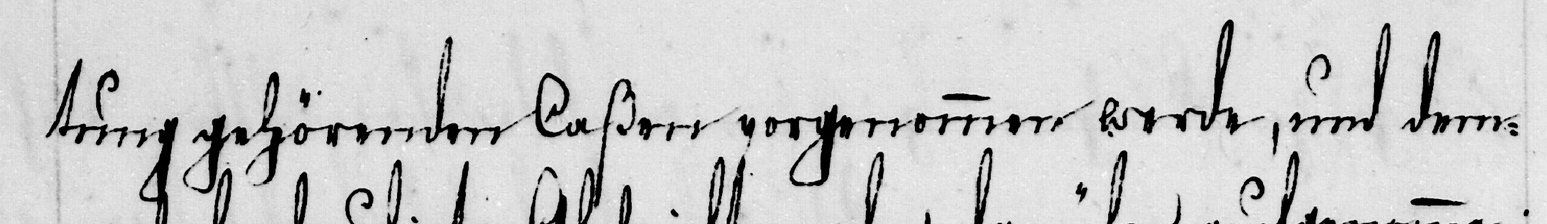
tung gehörenden Caßen vorgenommen werde, und dem¬
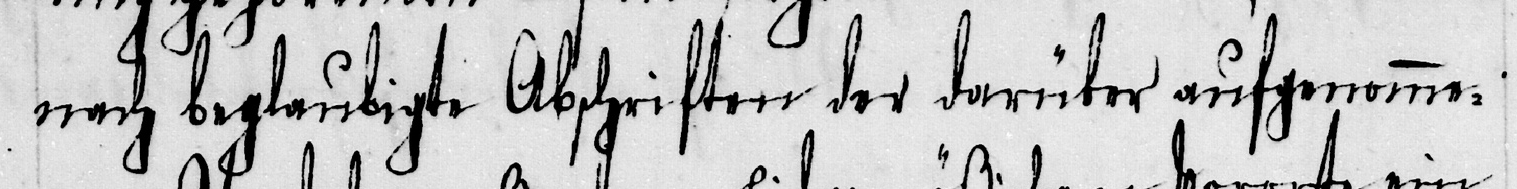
nach beglaubigte Abschriften der darüber aufgenomme¬
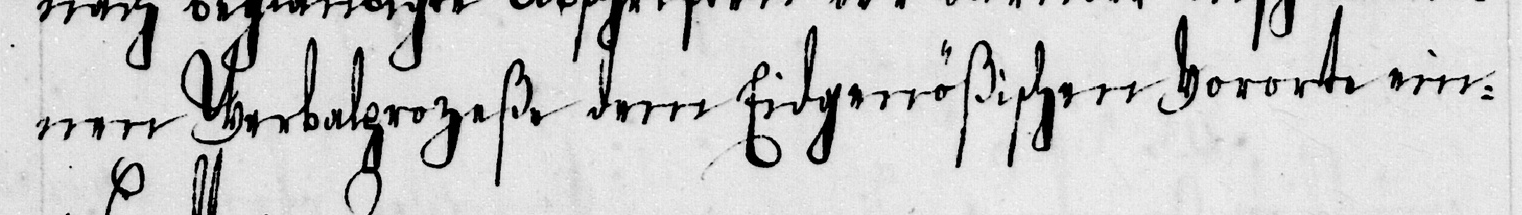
nen Verbalprozeße dem Eidgenößischen Vororte ein¬
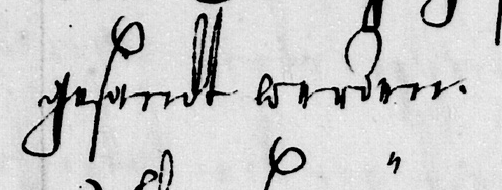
gesandt werden.
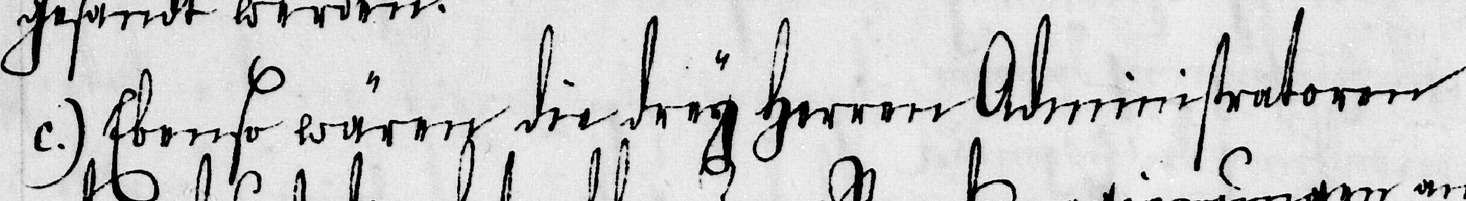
c.) Ebenso wären die drey Herren Administratoren
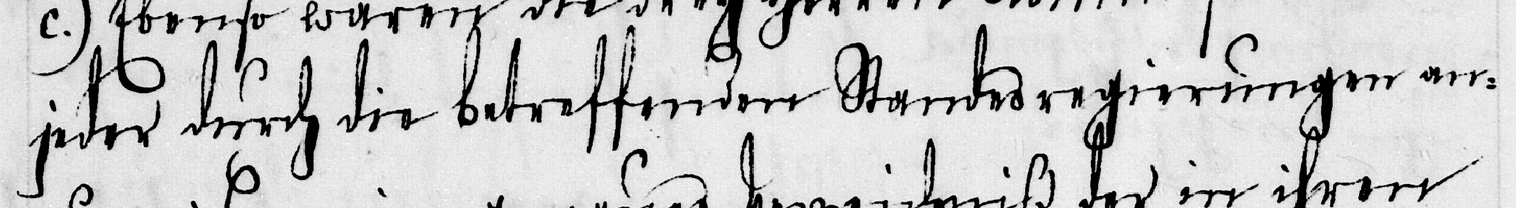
jeder durch die betreffenden Standesregierungen an¬
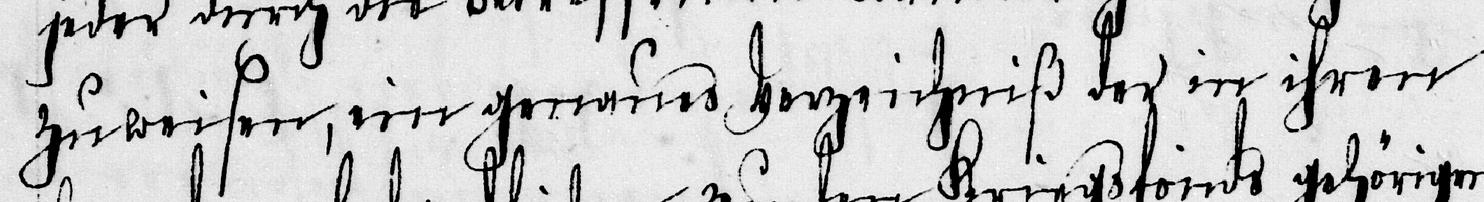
zuweisen, ein genaues Verzeichniß der in ihren
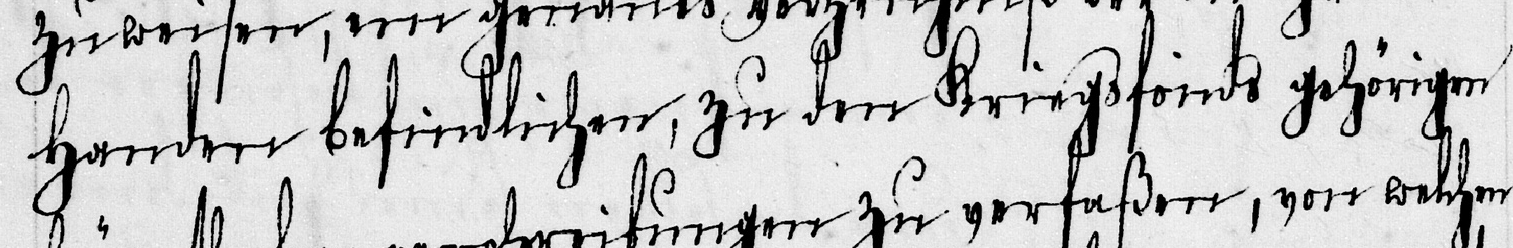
Handen befindlichen, zu den Kriegsfonds gehörigen
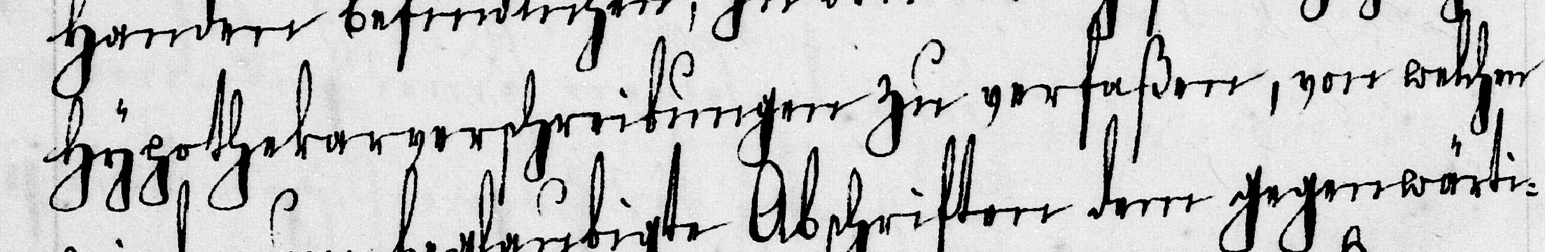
Hypothekarverschreibungen zu verfaßen, von welchen
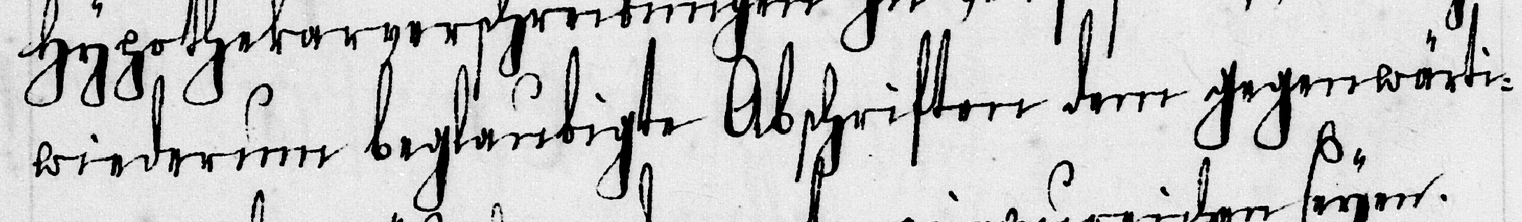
wiederum beglaubigte Abschriften dem gegenwärt¬
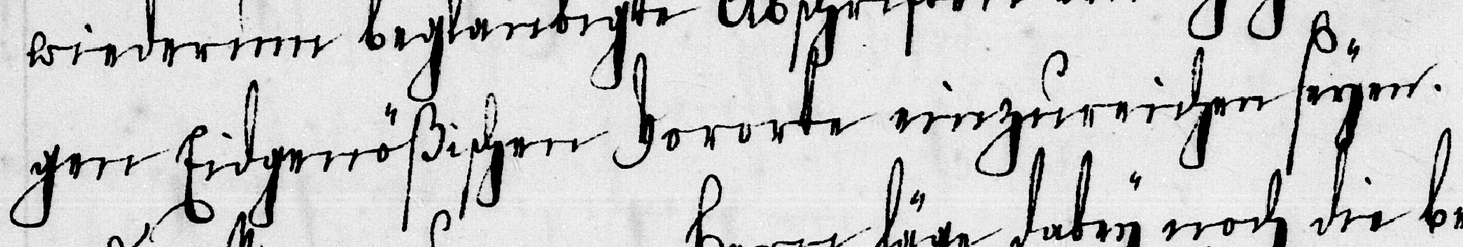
igen Eidgenößischen Vororte einzureichen seyen.
